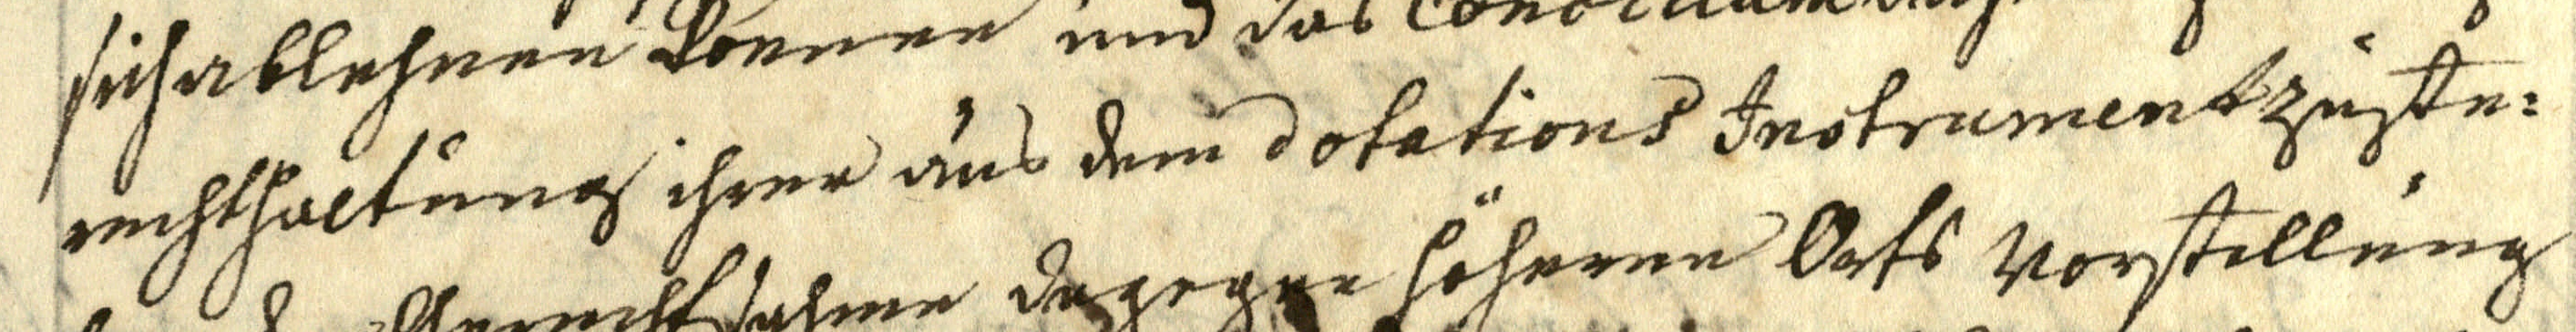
rechthaltung ihrer aus dem dotations Instrument zuste¬
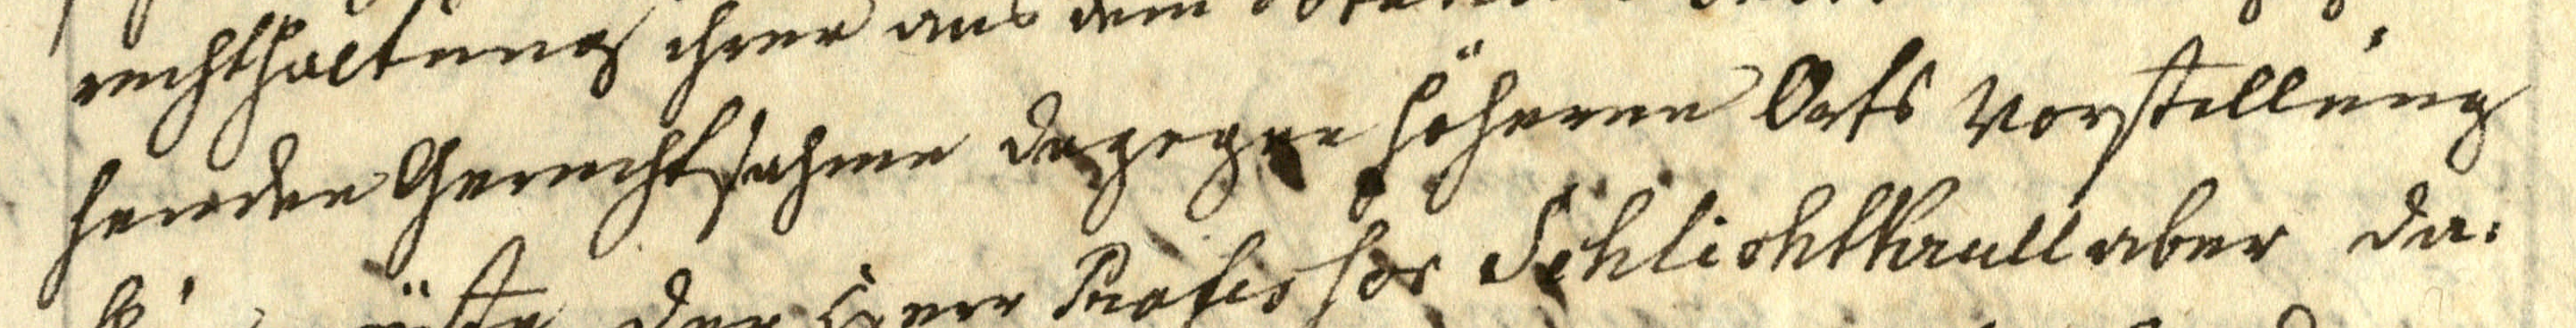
henden Gerechtsahme dagegen höheren Orts Vorstellung
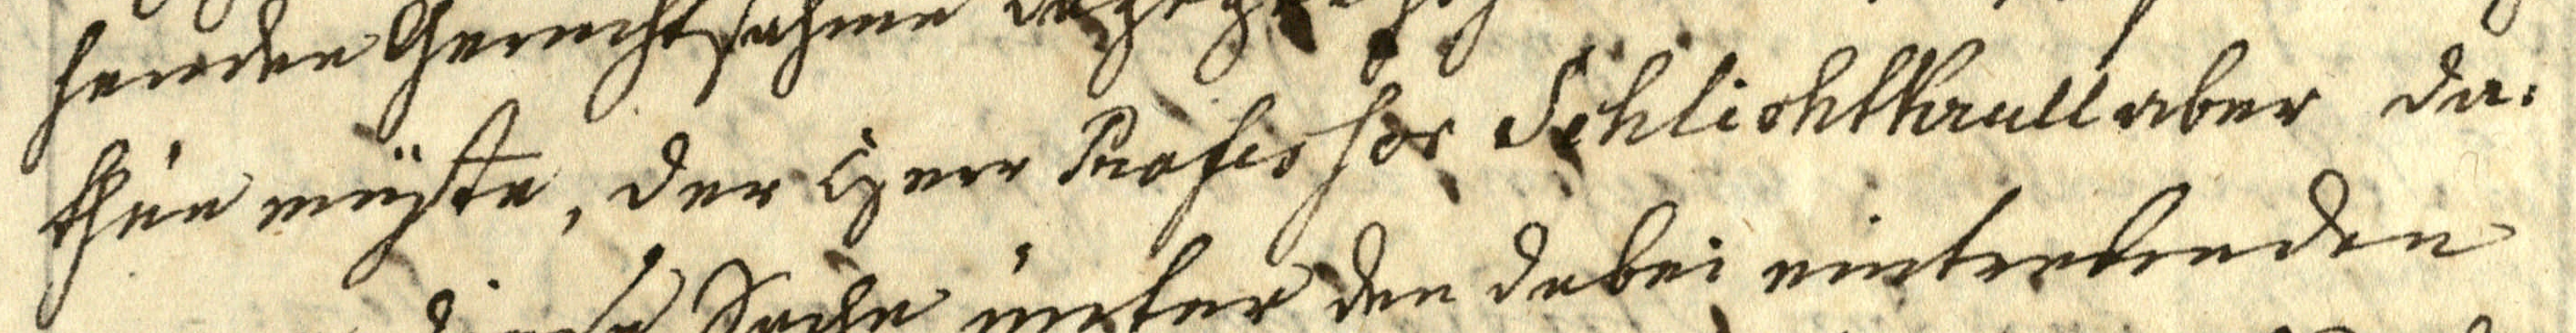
thun müste, der Herr Professor Schlichtkrull aber da¬
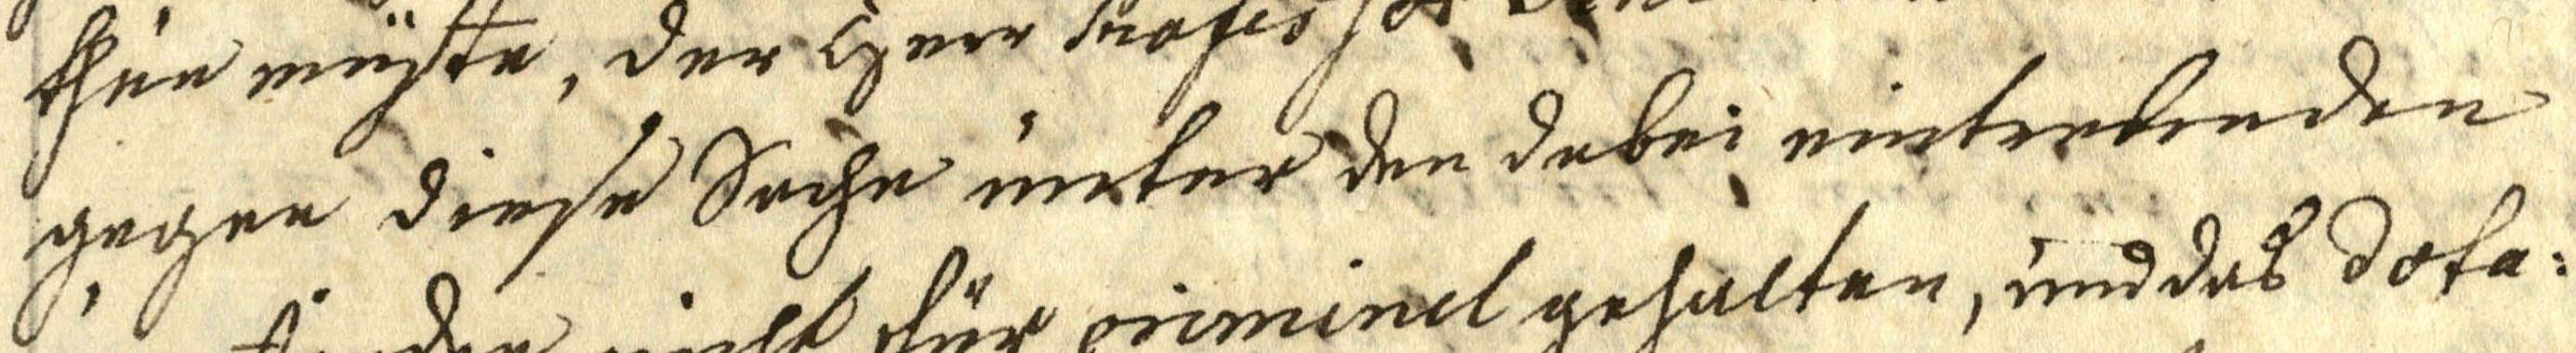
gegen diese Sache unter den dabei eintretenden
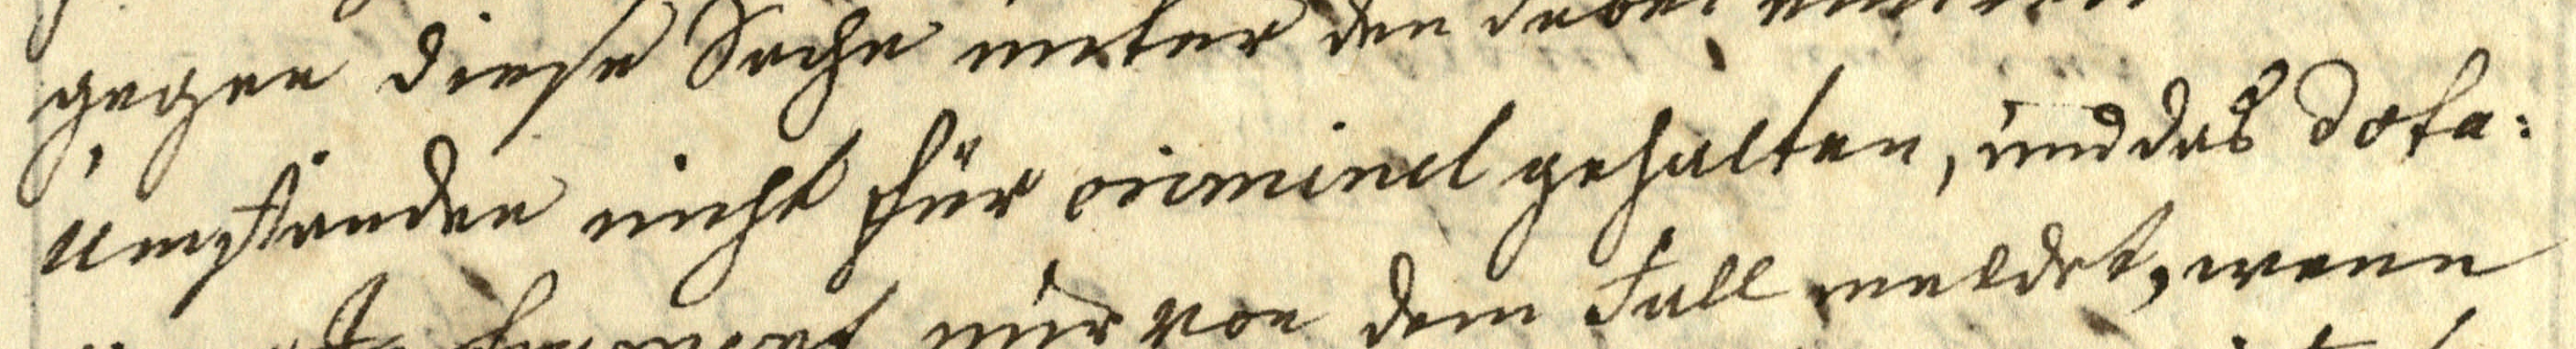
Umständen nicht für criminel gehalten, und das dota¬
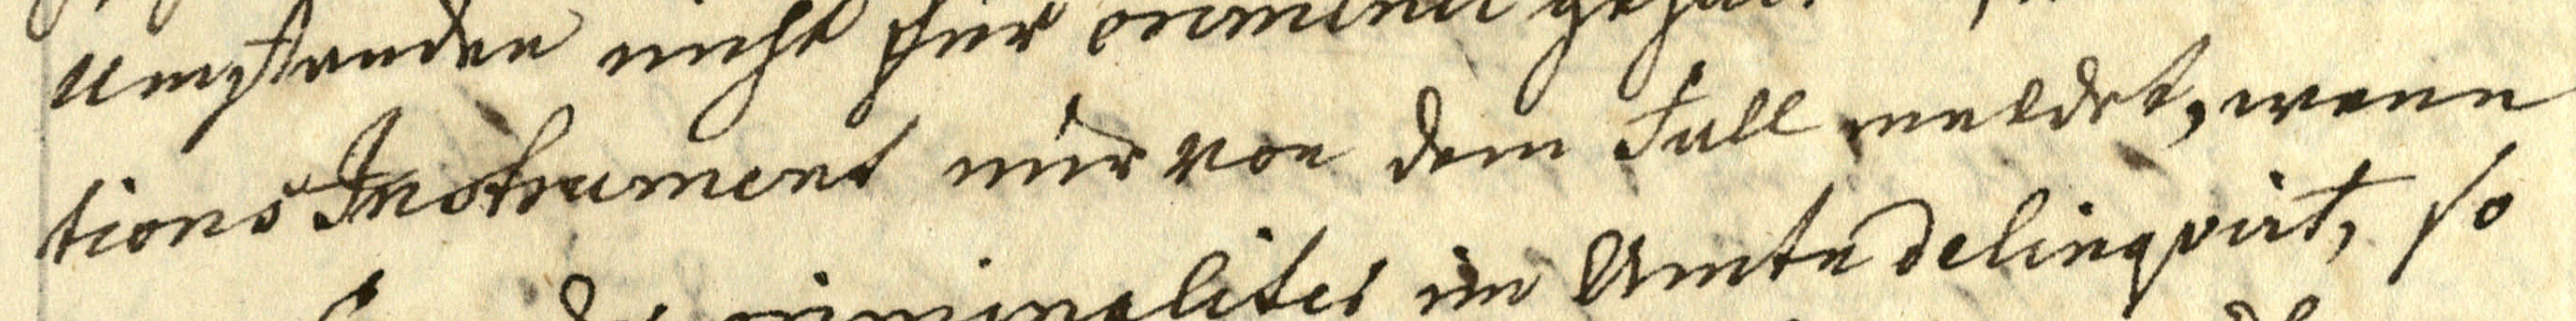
tions Instrument nur von dem Fall meldet, wenn
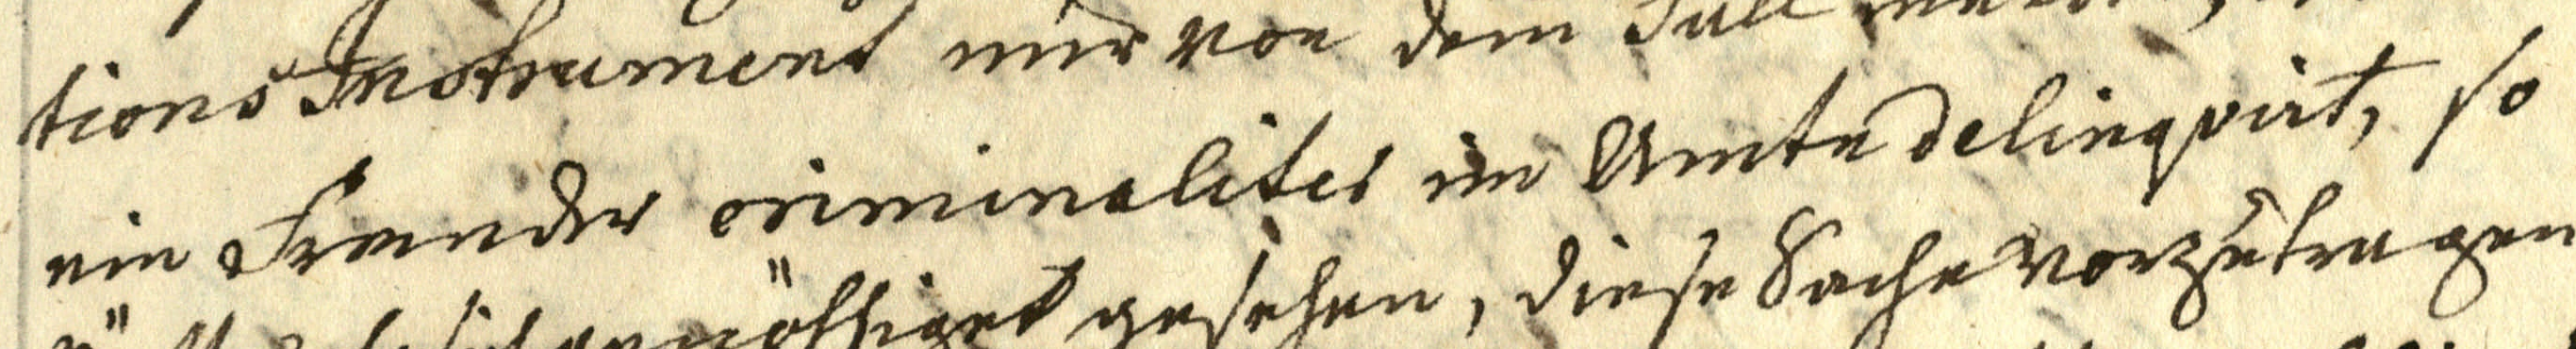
ein Fremder criminaliter in Amte delinquirt, so
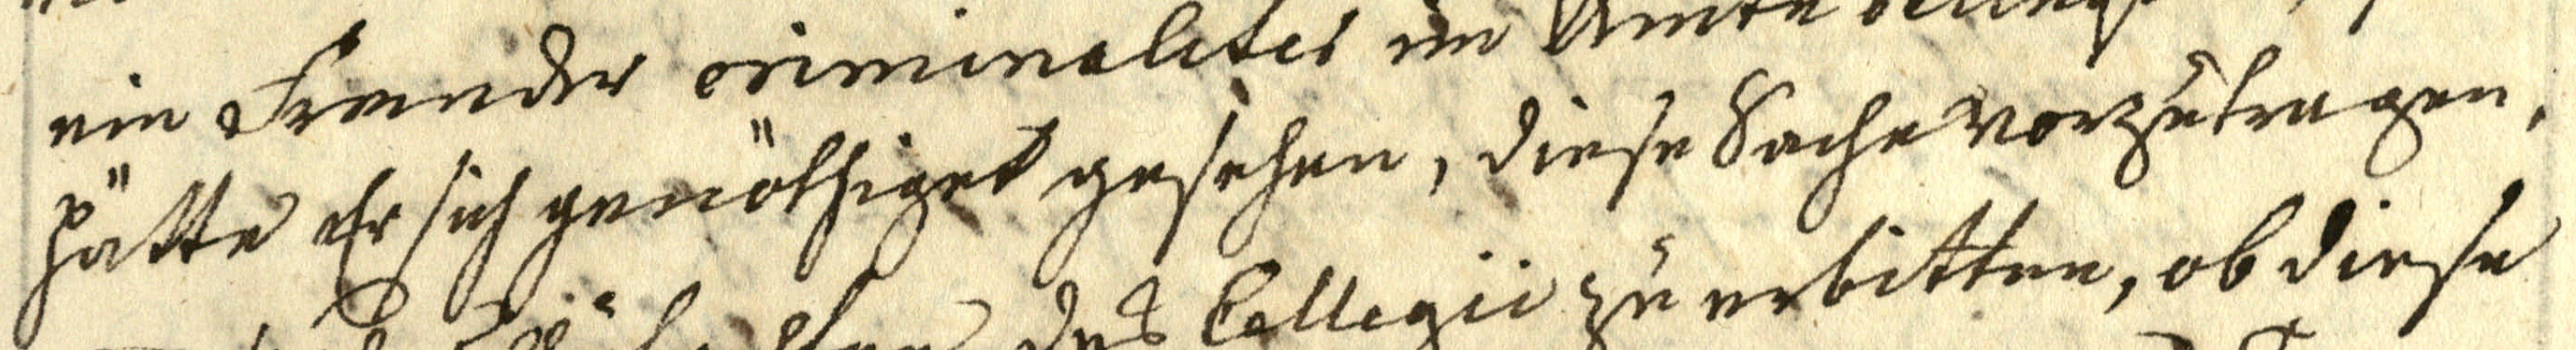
hätte Er sich genöthiget gesehen, diese Sache vorzutragen,
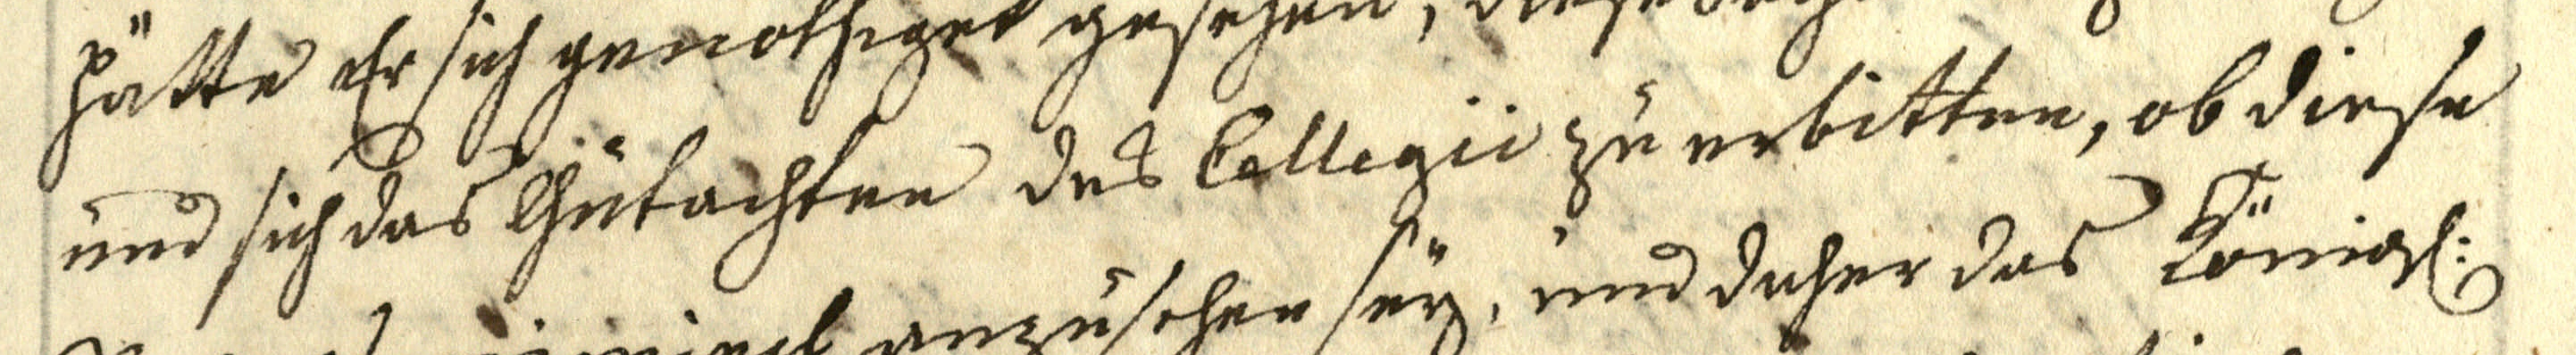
und sich das Gutachten des Collegii zu erbitten, ob diese
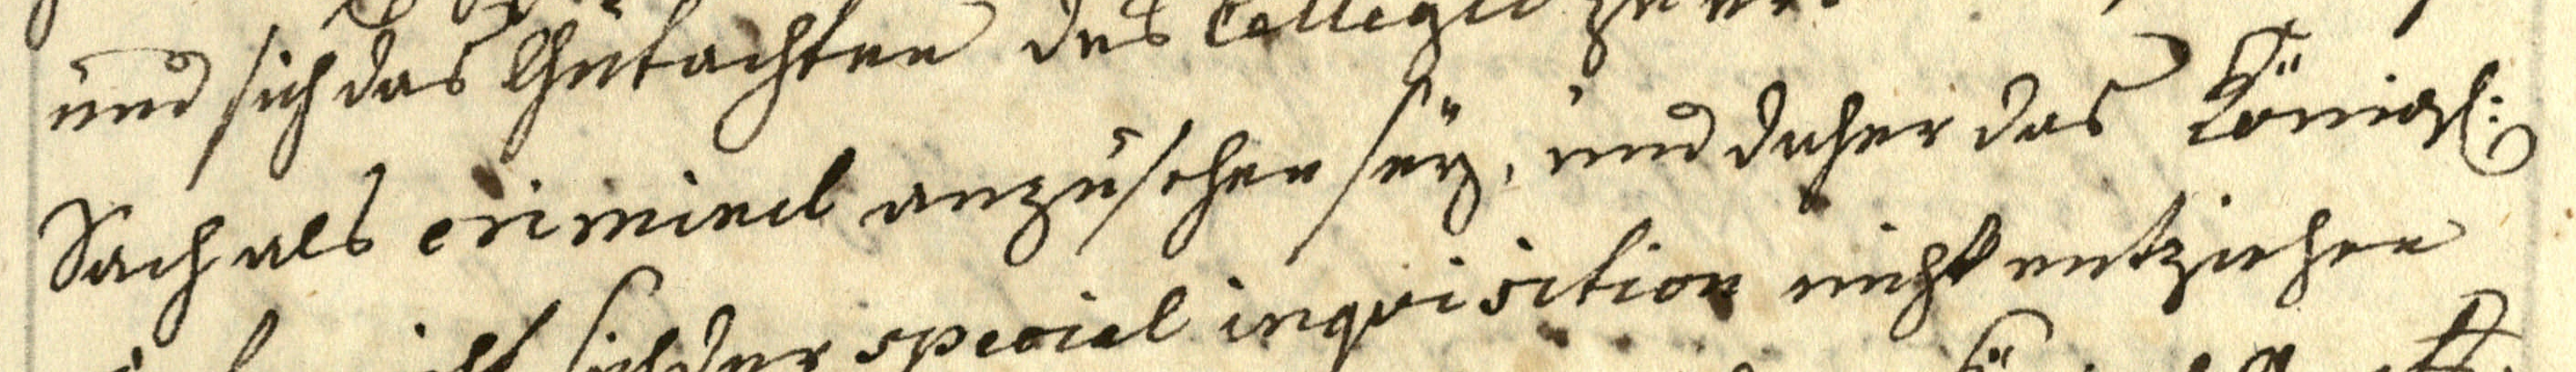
Sach als criminel anzusehen seÿ, und daher das Königl.
